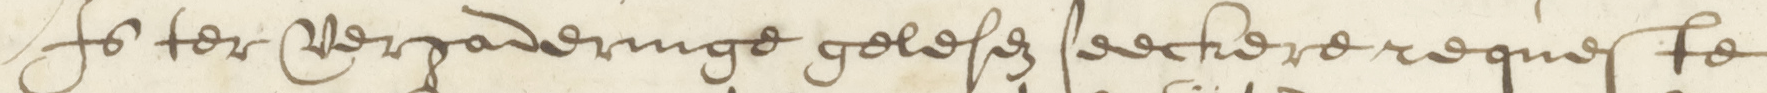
Is ter Vergaderinge gelesen seeckere requeste
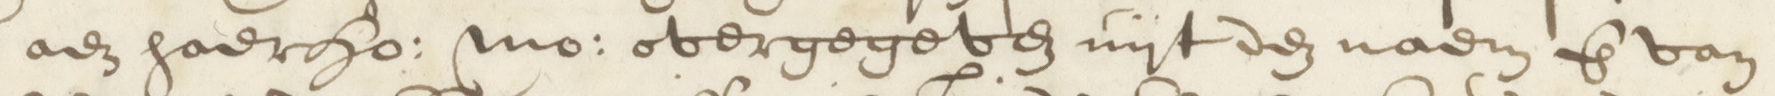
aen haer Ho:Mo: overgegeven uijt den naem & van
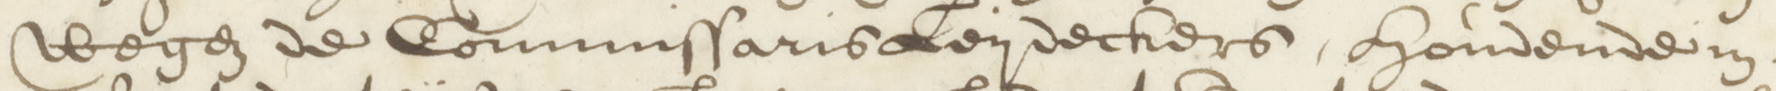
wegen de Commissaris Leijdeckers, houdende in
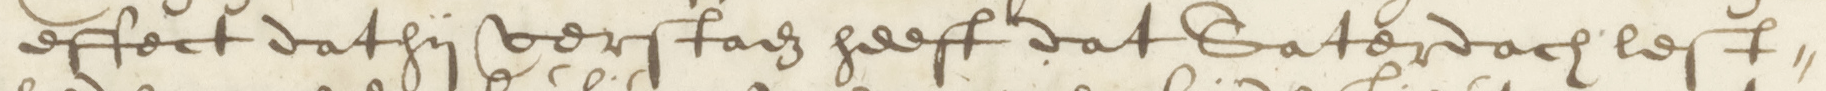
effect dat hij verstaen heeft dat Saterdach lest„
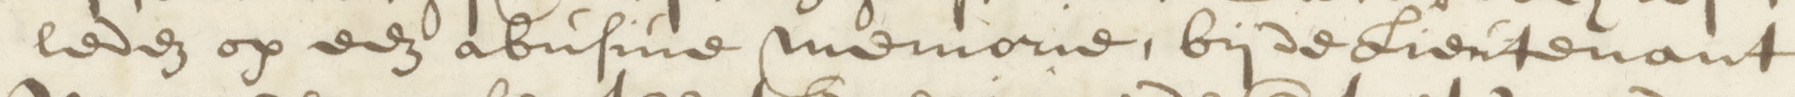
leden op een abusiue memorie, bij de Lieutenant
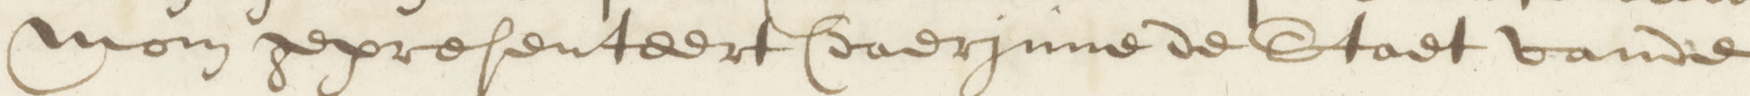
Mom gepresenteert (daerinne de Staet vande
